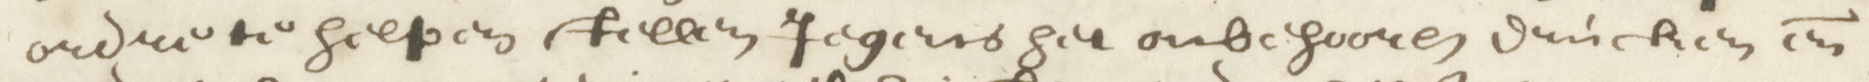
ordre te helpen stellen Jegens het onbehoorl drucken en
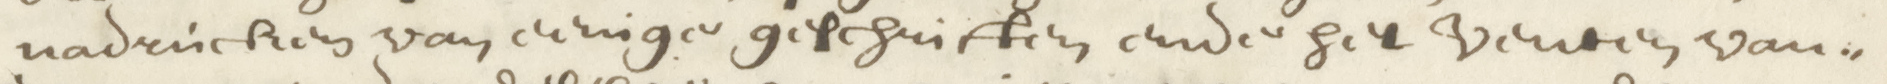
nadrucken van eenige geschriften ende het venten van,,
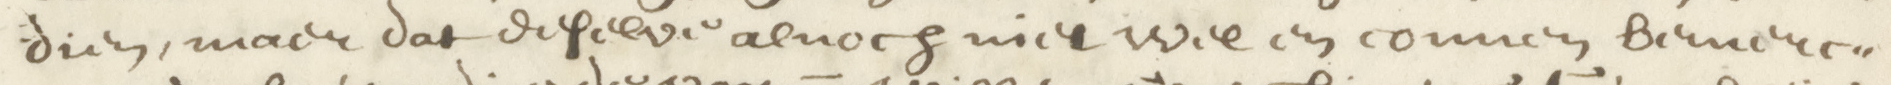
dien, maer dat deselve alnoch niet wel en connen bemerc,,
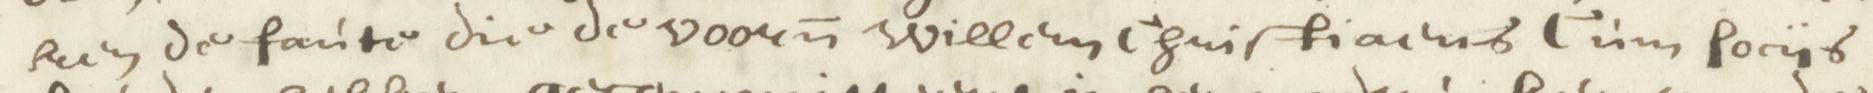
ken de faute die de voorn Willem Christiaens Cum socijs
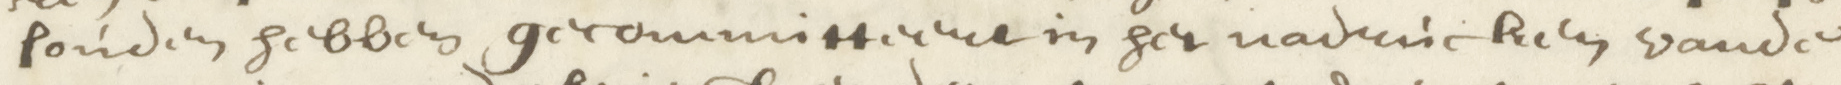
souden hebben gecommitteert in het nadrucken vande
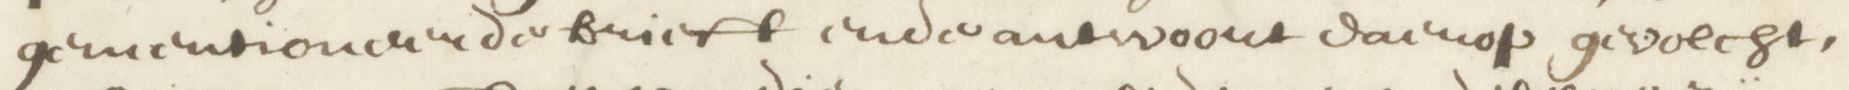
gementioneerde brieff ende antwoort daerop gevolcht,
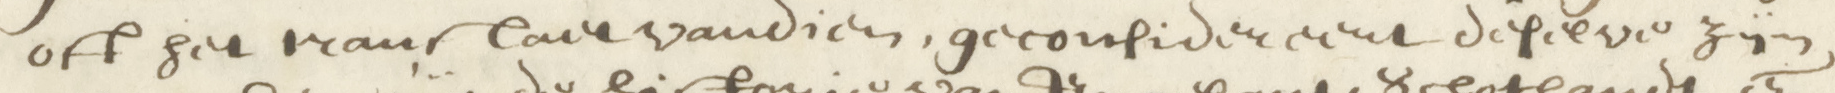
off het translaet vandien, geconsidereert deselve zijn
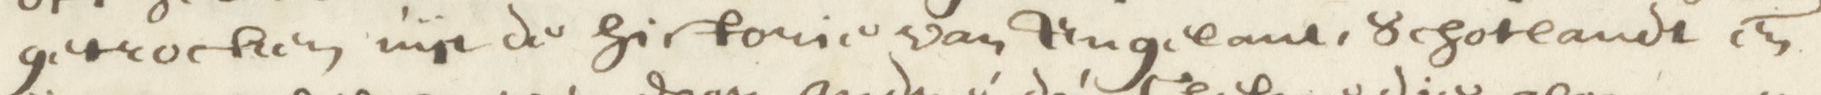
getrocken uijt de historie van Engelant, Schotlandt en
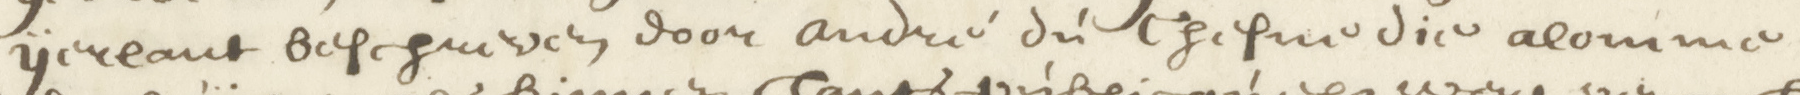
ijerlant beschreven door andré du Chesne die alomme
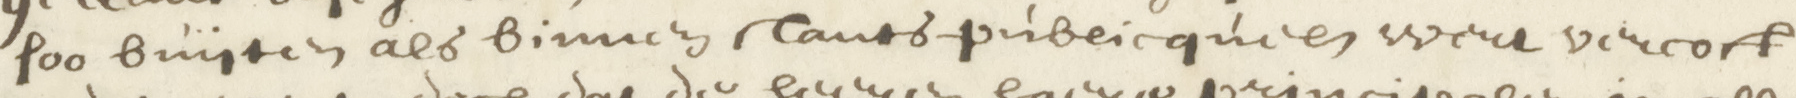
soo buijten als binnen slants publicquel wert vercoft
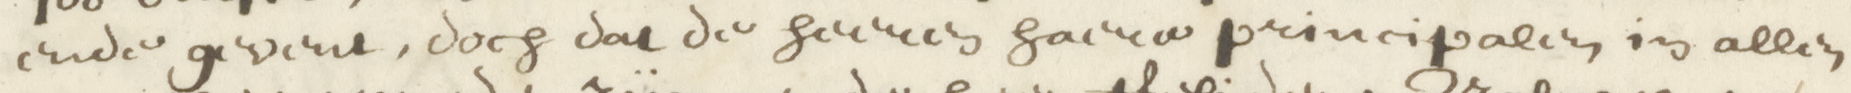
ende gevent, doch dat de heeren haere principalen in allen
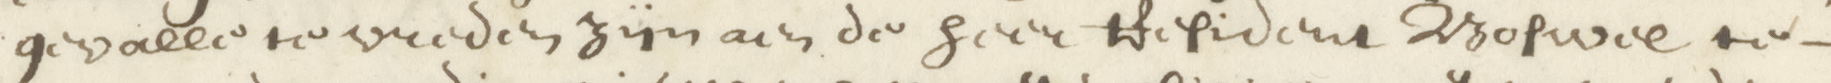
gevalle te vreden zijn aen de heer Resident Boswel te
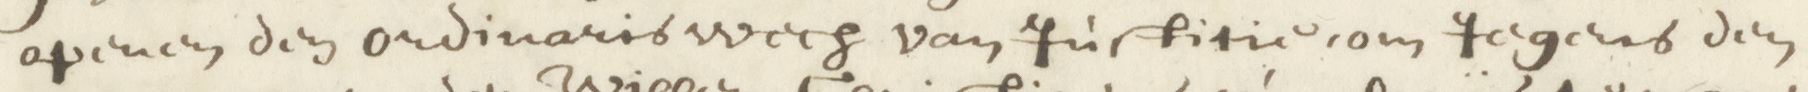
openen den ordinaris wech van Justitie, om Jegens den
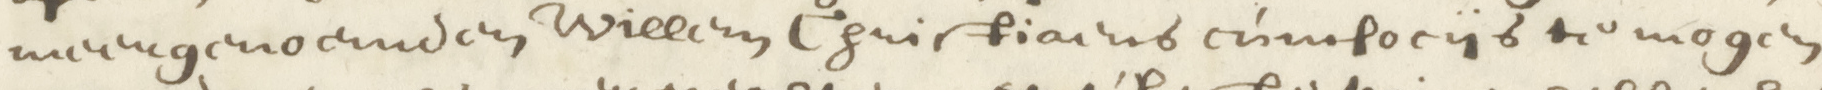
meergenoemden Willem Christiaens cum socijs te mogen
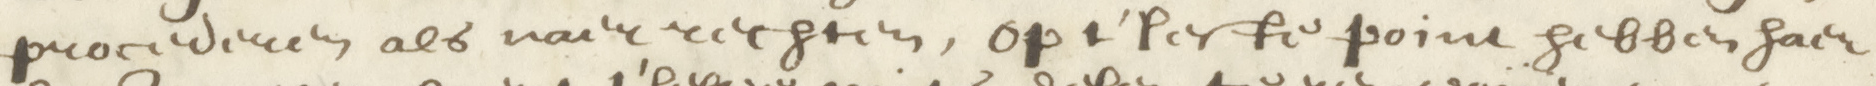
procederen als naer rechten, op t' seste point hebben haer
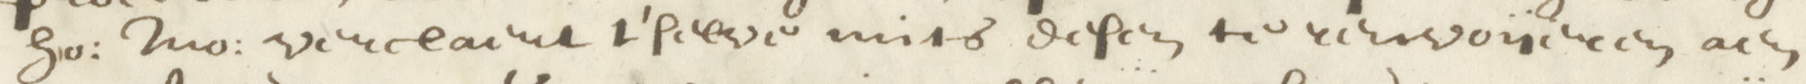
ho:mo: verclaert t'selve mits desen te renvoijeren aen
